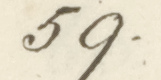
59.
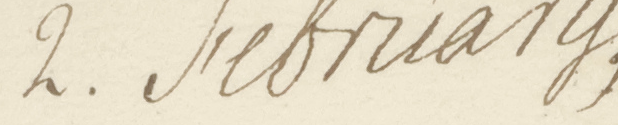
2. Februarij,
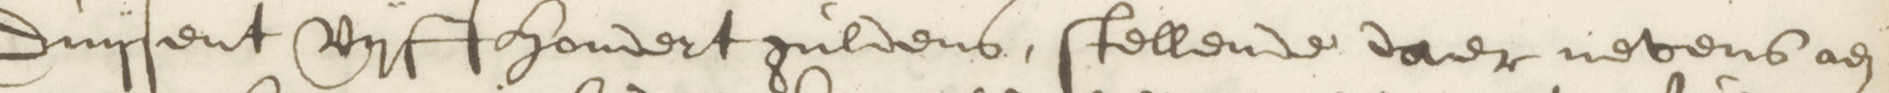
duijsent vijffhondert guldens, stellende daer nevens aen
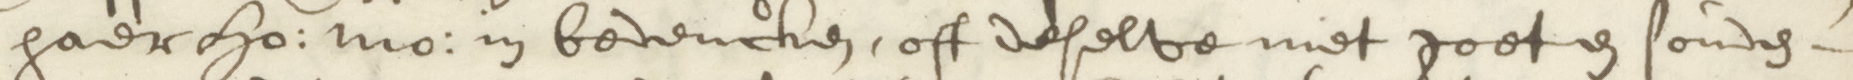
haer Ho:Mo: in bedencken, off deselve niet goet en souden —
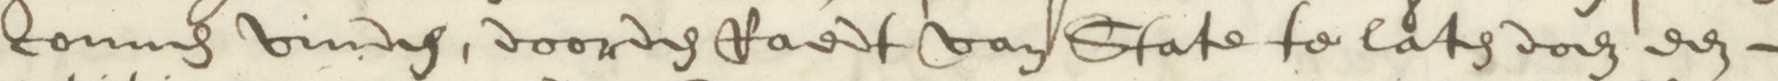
connen vinden, door den Raedt van State te laten doen een —
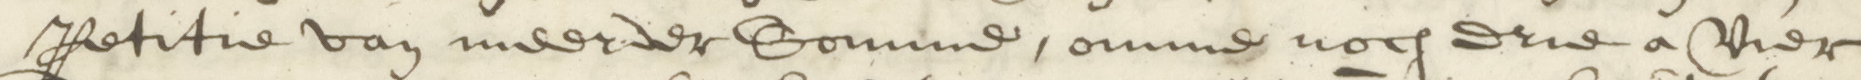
Petitie van meerder Somme, omme noch drie a vier
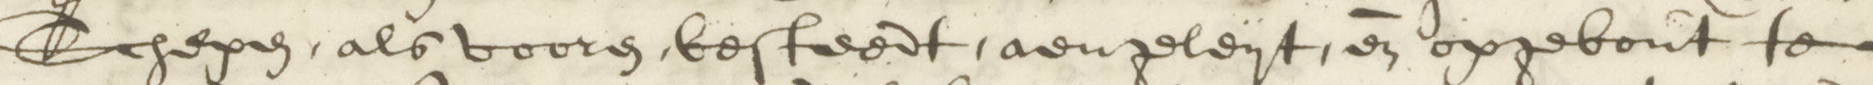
Schepen, als vooren, besteedt, aengeleijt, en opgebout te
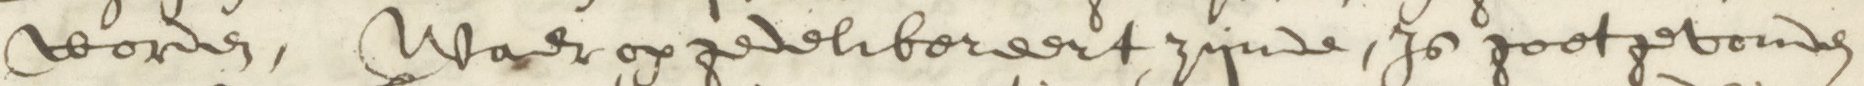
worden. Waerop gedelibereert zijnde, Is goetgevonden
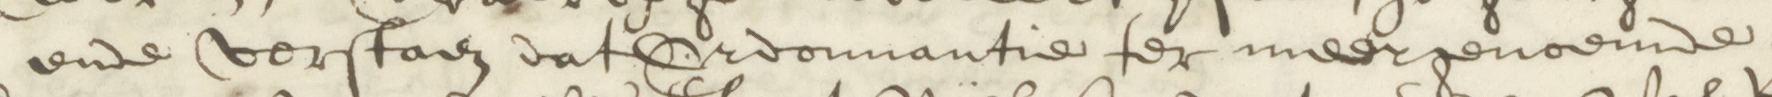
ende verstaen dat Ordonnantie ter meergenoemde —
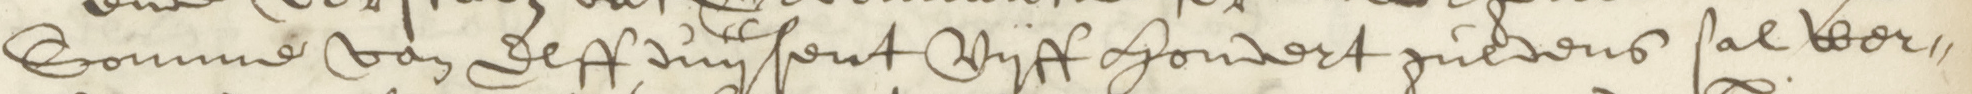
Somme van Elff duijsent Vijff hondert guldens sal wer„
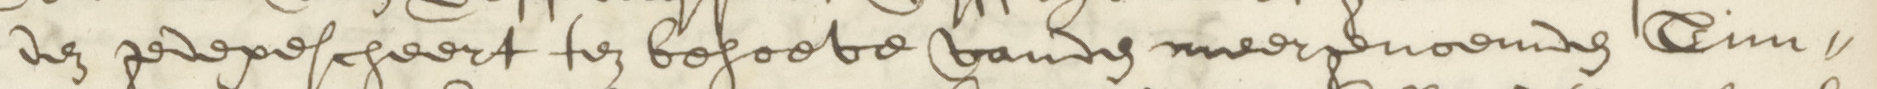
den gedepescheert ten behoeve vanden meergenoemden Tim„
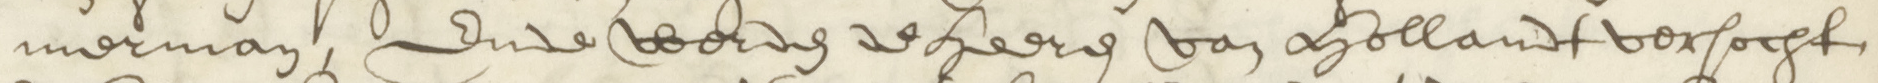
merman. Ende werden de Heeren van Hollandt versocht
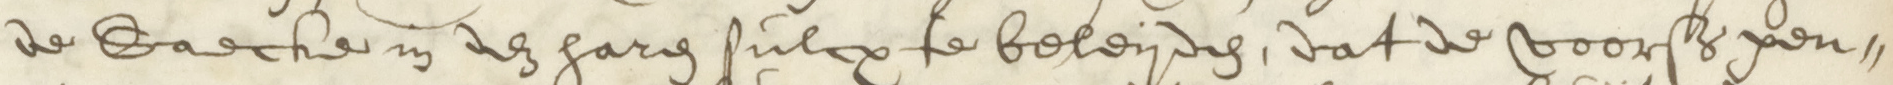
de Saecke in den haren sulcx te beleijden, dat de voors pen„
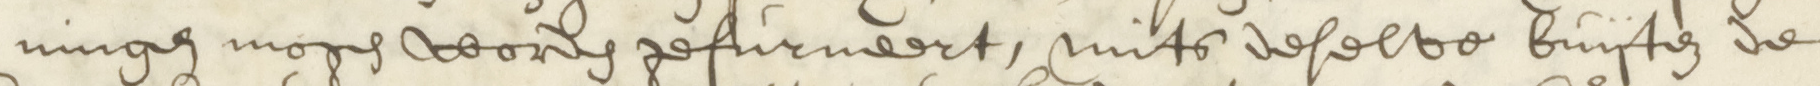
ningen mogen worden gefurneert, mits deselve buijten de
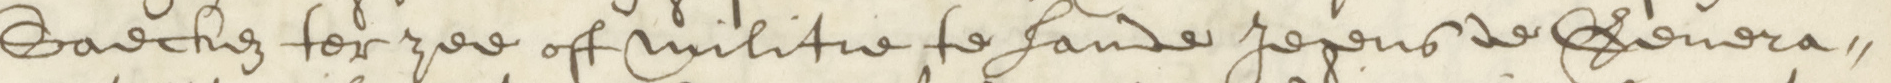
Saecken ter zee off militie te Lande Jegens de Genera„
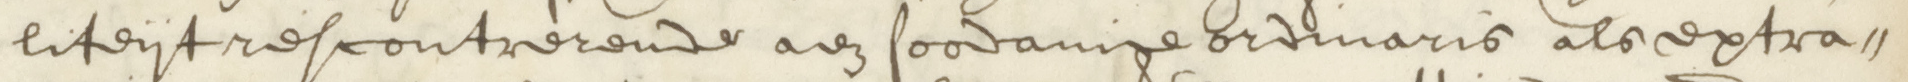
liteijt rescontrerende aen soodanige ordinaris als extra„
